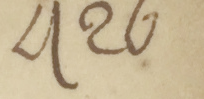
426
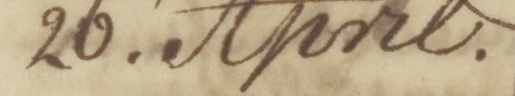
26. April.
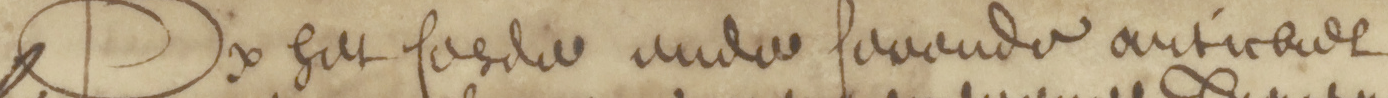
Op het sesde ende sevende artickel
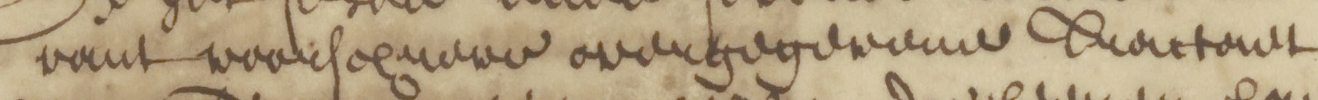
vant voorschreve overgegevene Tractaet
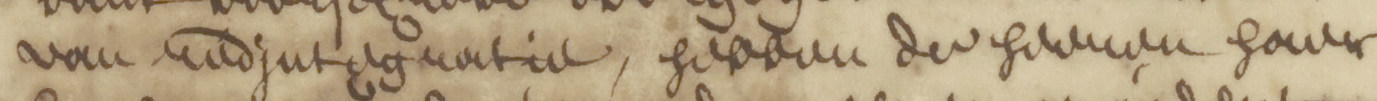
van redintegratie, hebben de heeren haer
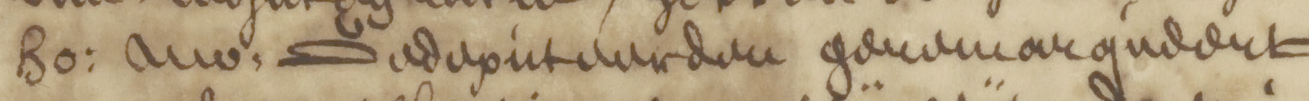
Ho:Mo: Gedeputeerden geremarqueert
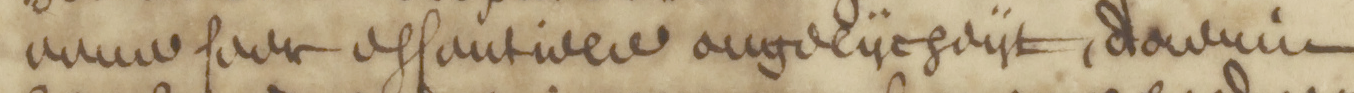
eene seer essentiele ongelijcheijt, daerin
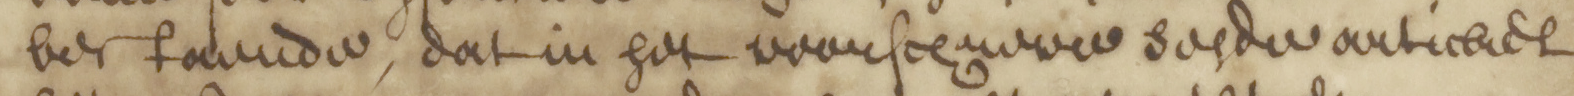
bestaende, dat in het voorschreve selde artickel
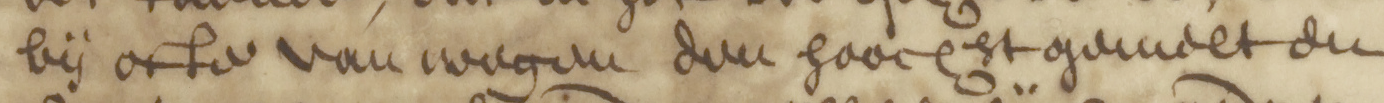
bij ofte van wegen den hoochst gemelten
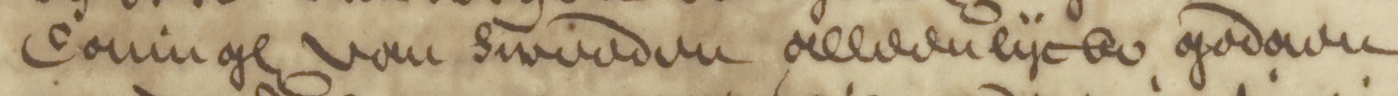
Coningh van Sweeden alleenlijck gedaen
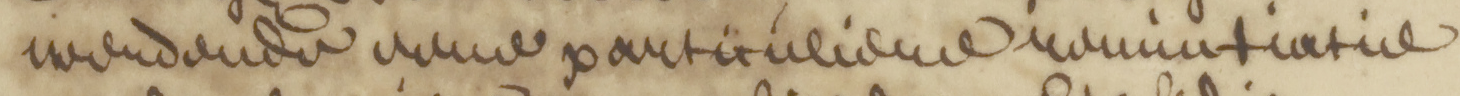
werdende eene particuliere renuntiatie
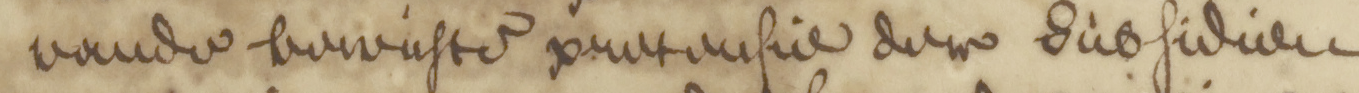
vande bewuste pretensie der Subsidien
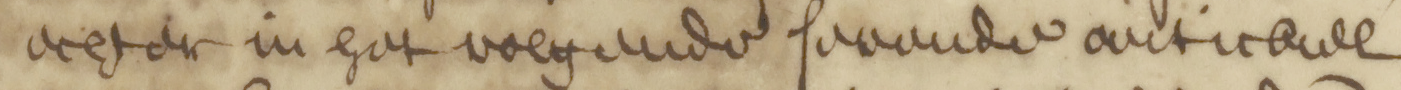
echter in het volgende sevende artickel
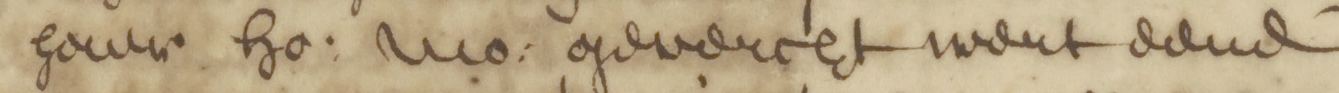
haer Ho:Mo: gevercht wert eene
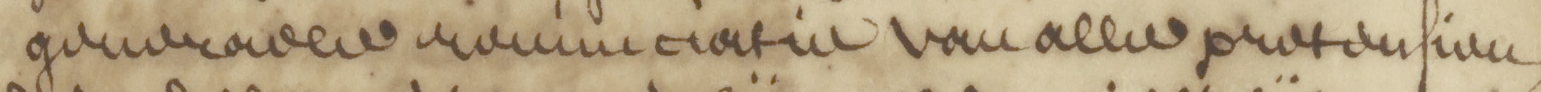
generaele renunciatie van alle pretensien
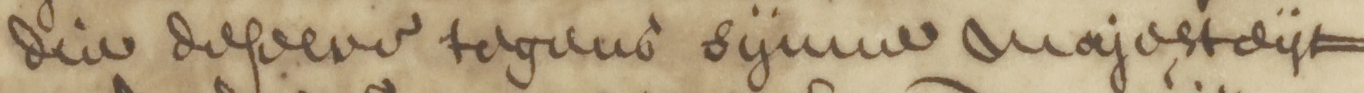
die deselve tegens Sijne Majesteijt
